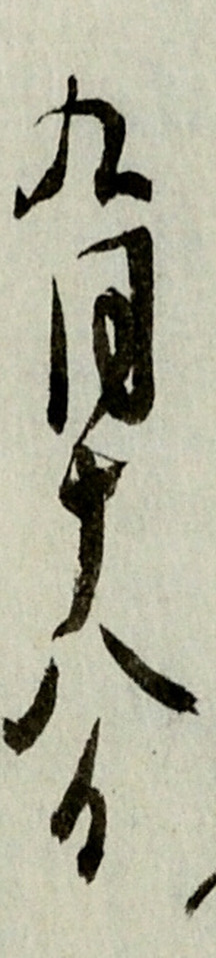九月十八日
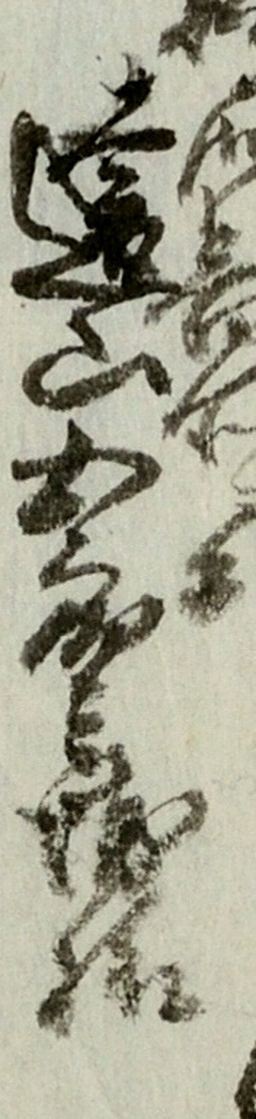遠山五郎兵衛様
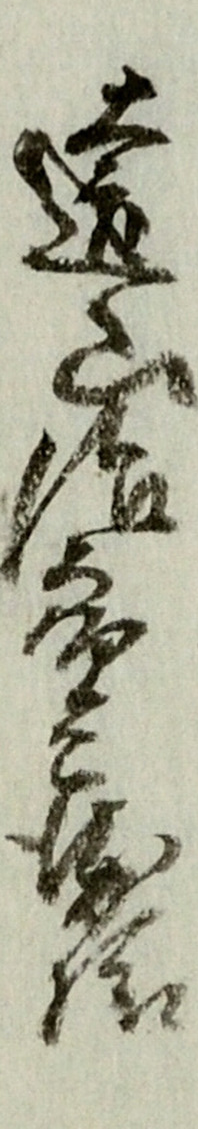遠山五郎兵衛様
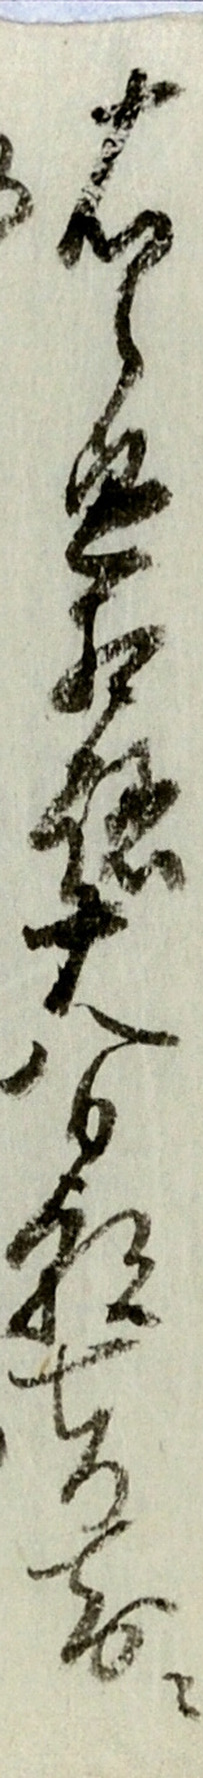右之通相認十八日朝七つ前に
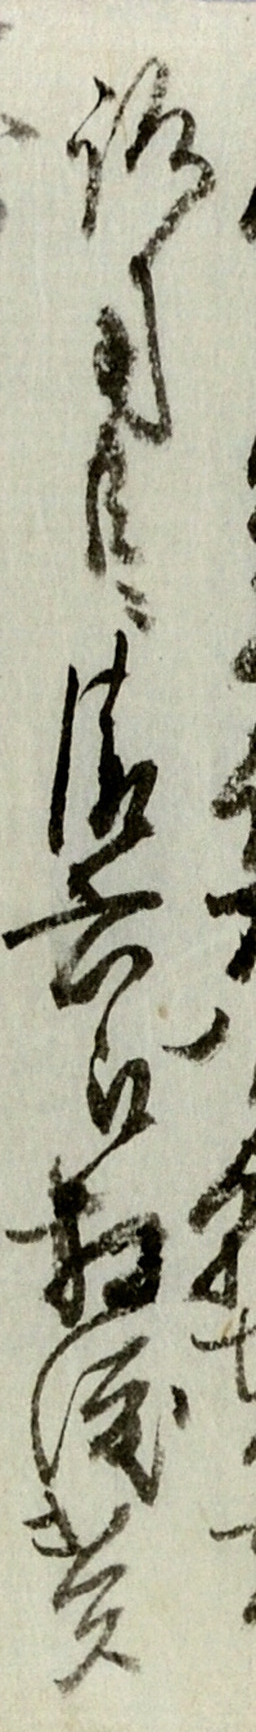御用共に清六え相渡遣ス
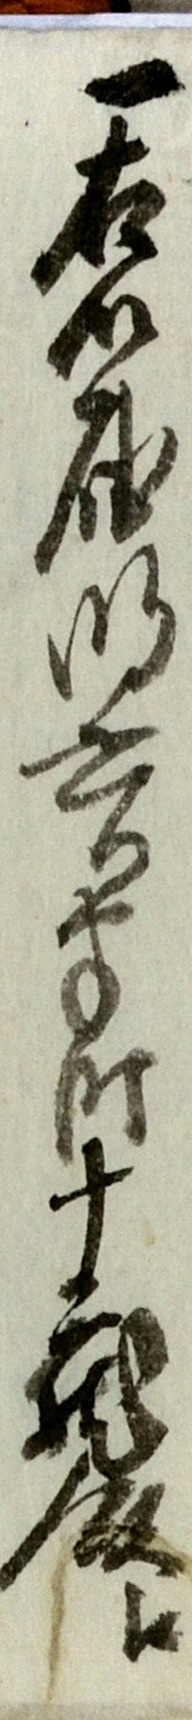一右御届明六つ半時十蔵殿え
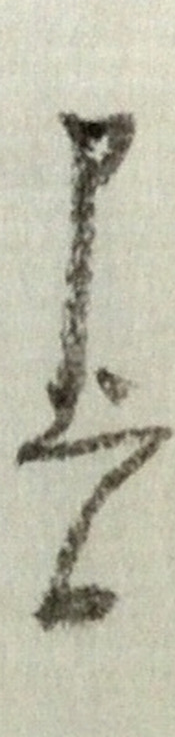申上候
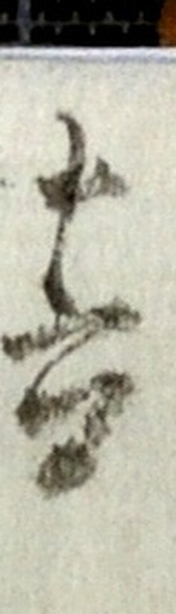十六日
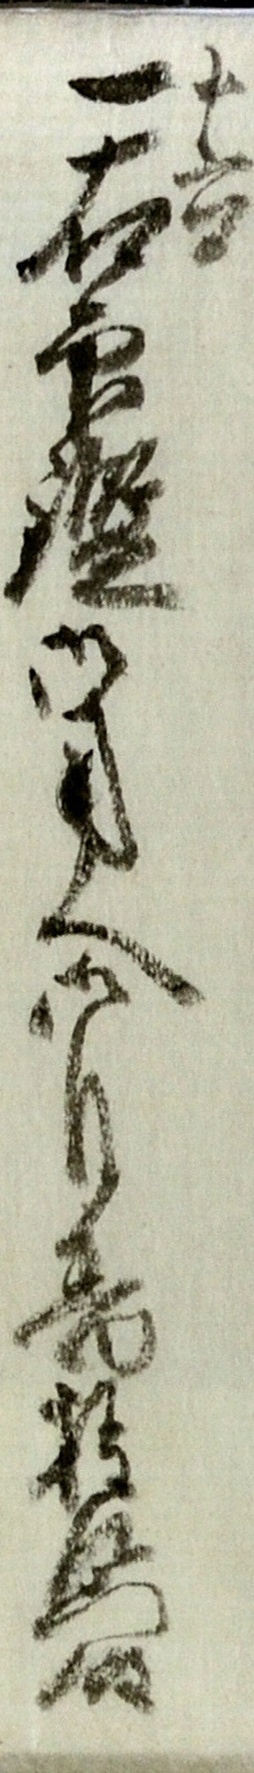一右印鑑御用人御月番権左衛門殿

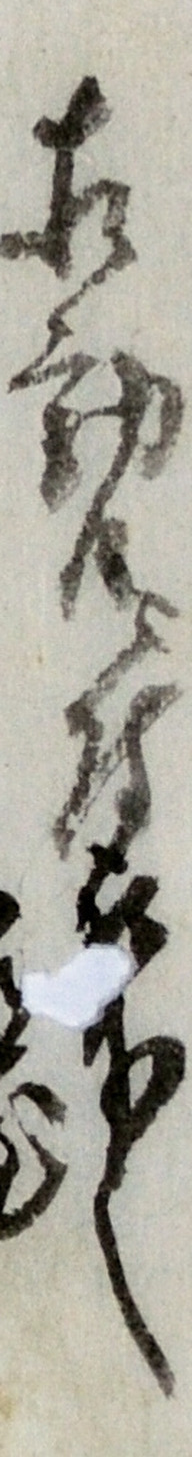相勤候に付被下候
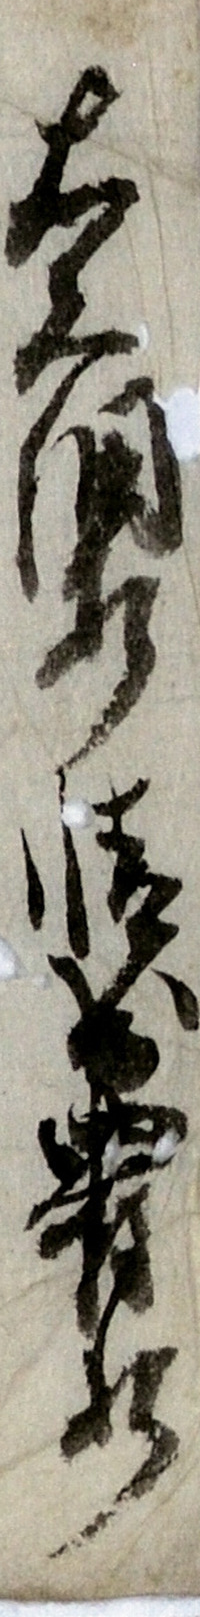右は網打情出骨折
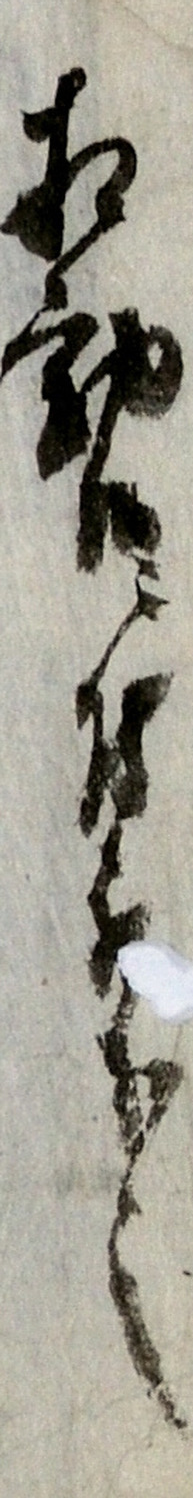相勤候に付被下候
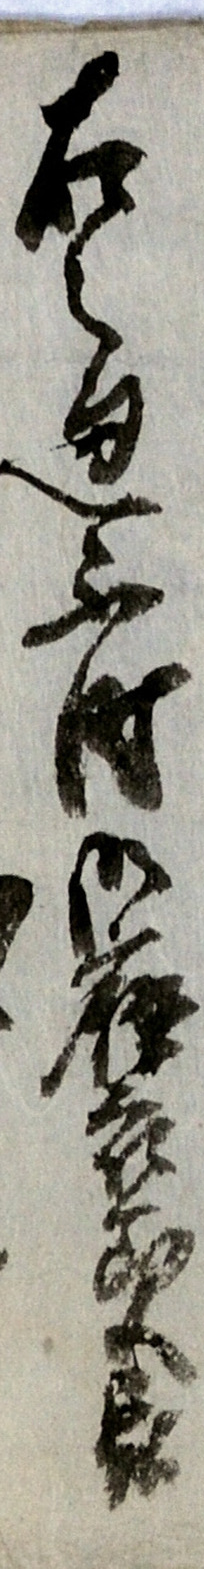右之通不時御褒美被
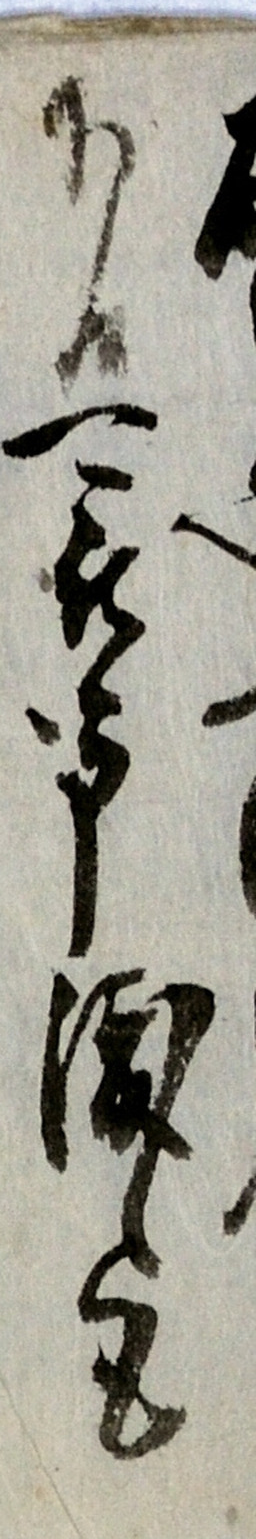下候可被申渡候以上
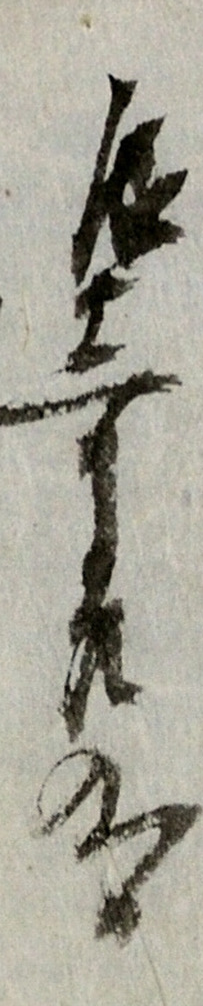辰十二月廿九日
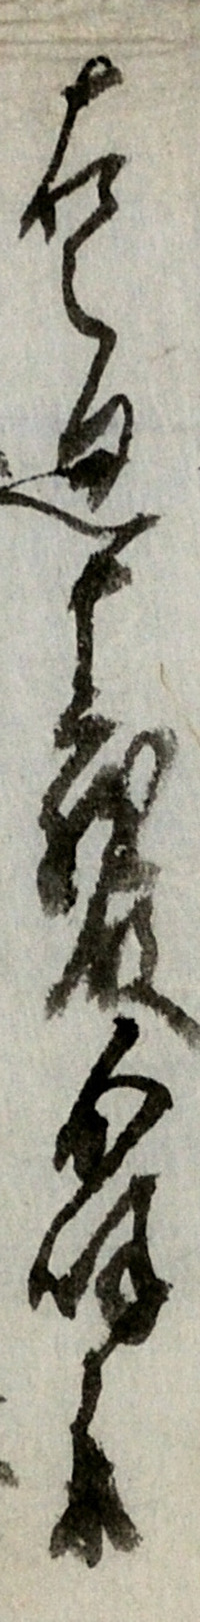右之通十蔵殿ゟ呼之義
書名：分一方諸事御用留帳
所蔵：伊那市立高遠町図書館・合同会社AMANE
